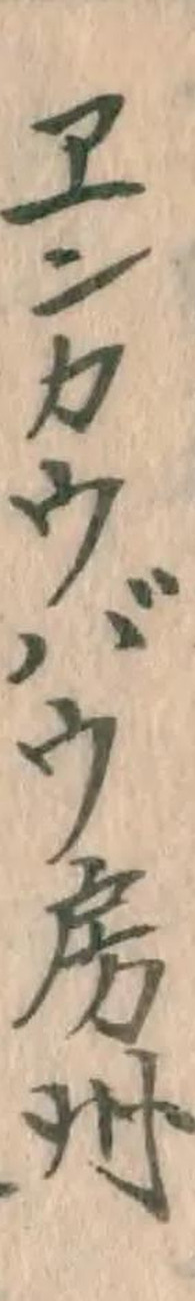ヱンカウバウ房州
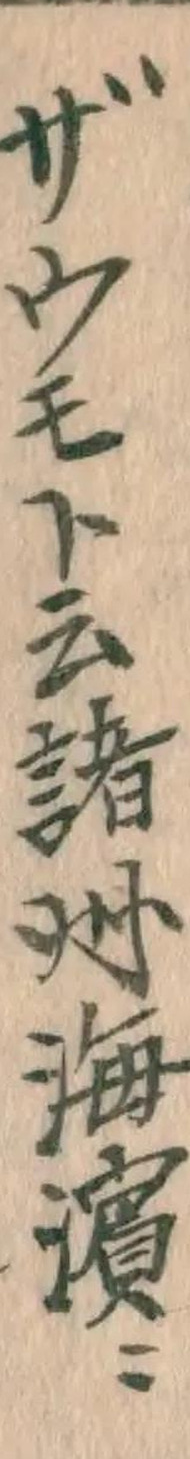ザウモト云諸州海浜ニ
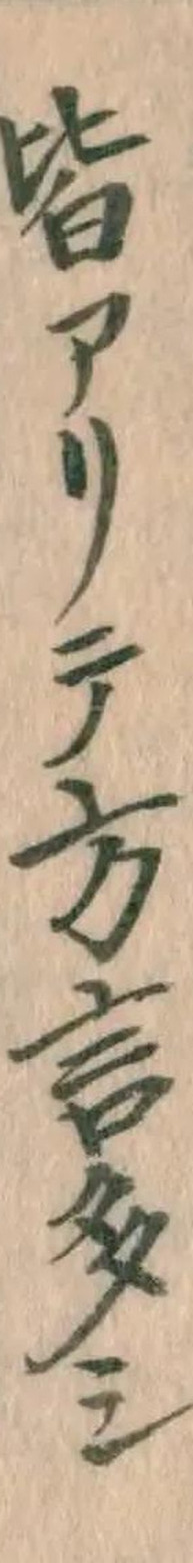皆アリテ方言多シ
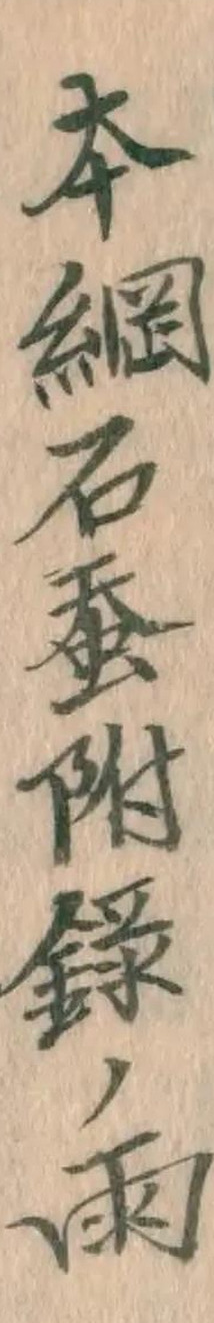本綱石蚕附録ノ雨
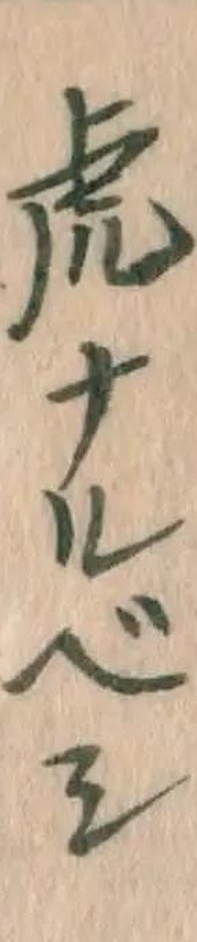虎ナルベシ
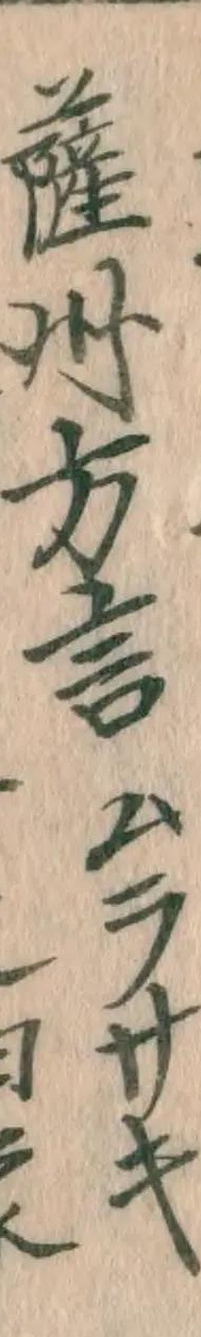薩州方言ムラサキ
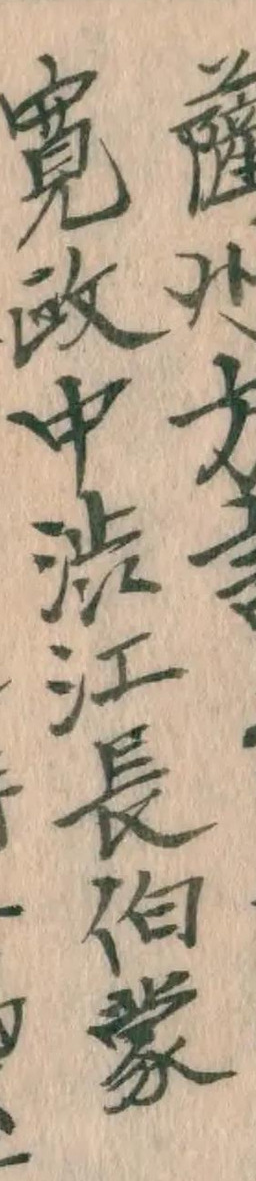寛政中渋江長伯蒙台
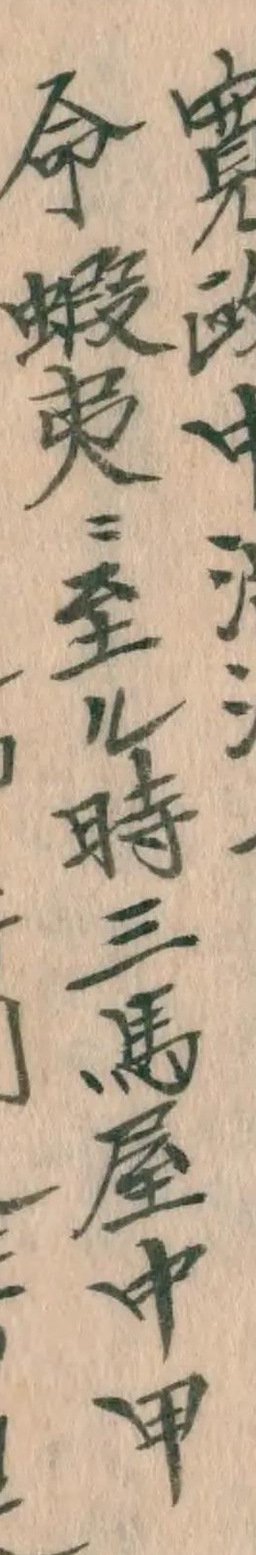命蝦夷ニ至ル時三馬屋中甲
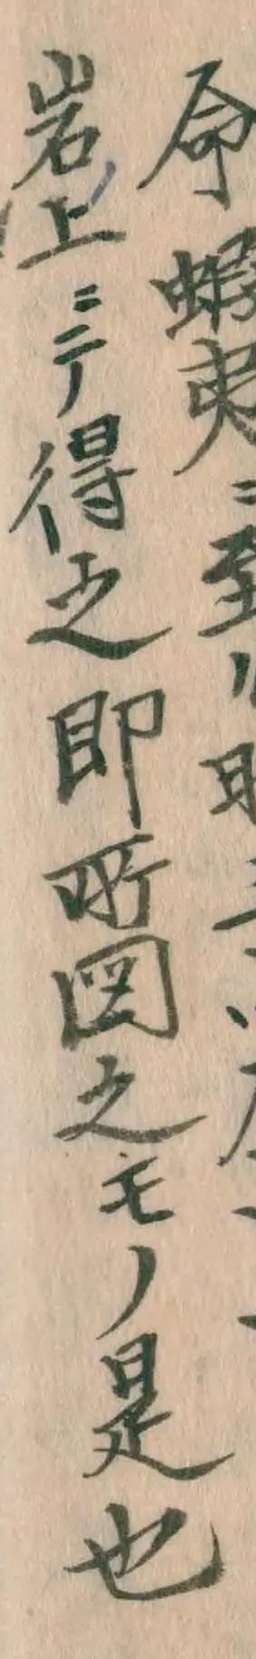岩ノ上ニテ得之即所図之モノ是也
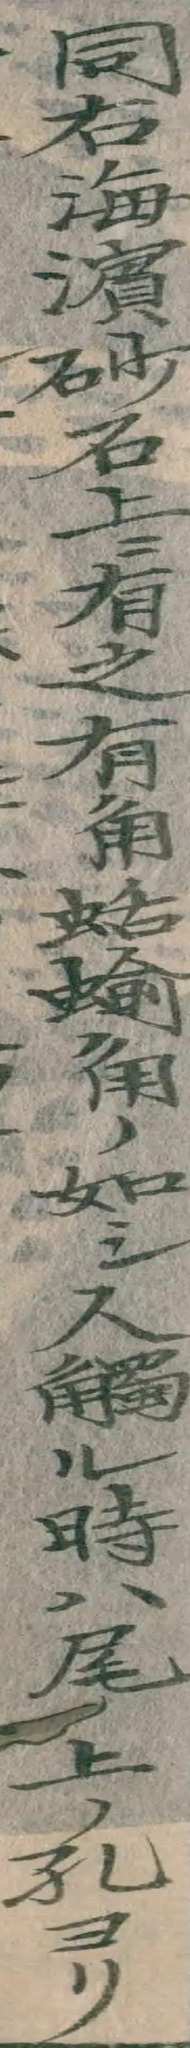同右海浜砂上ニ有之有角蛞蝓角ノ如シ人触ル時ハ尾上ノ孔ヨリ
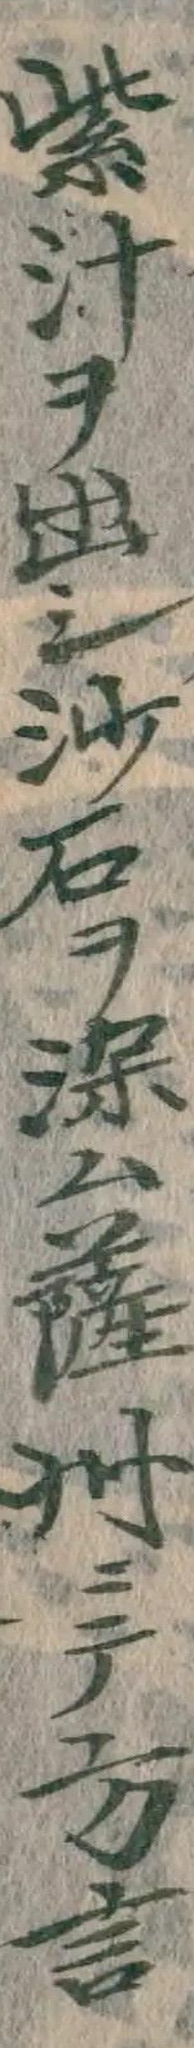紫汁ヲ出シ沙石ヲ染ム薩州ニテ方言
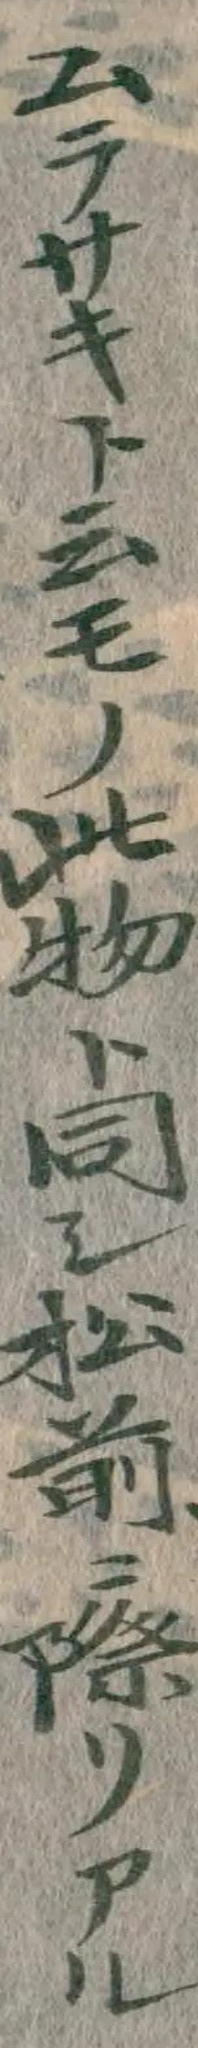ムラサキト云モノ此物ト同シ松前ニ際リアル
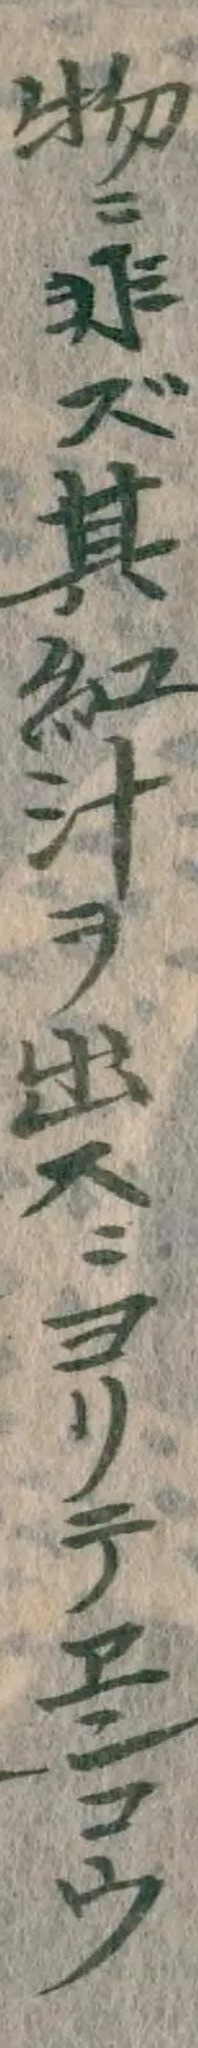物ニ非ズ其紅汁ヲ出スニヨリテヱンコウ
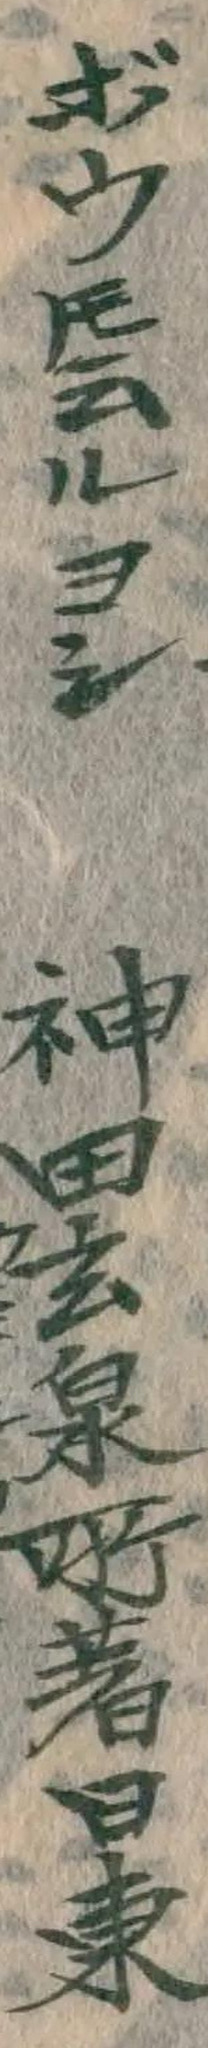ボウトモ云ルヨシ神田玄泉所著日東
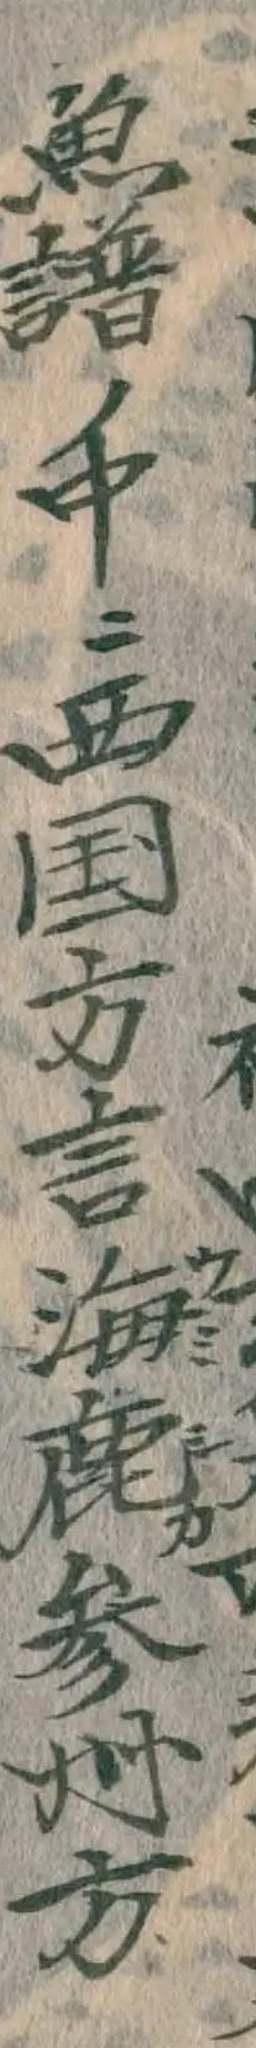魚譜ノ中ニ西国方言海鹿参州方
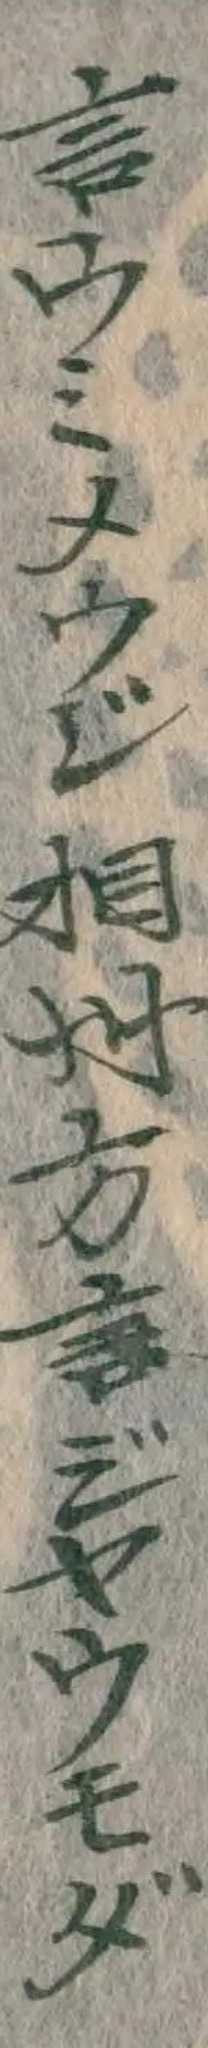言ウミメウジ相州方言ジヤウモダ
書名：千蟲譜 3巻. [3]
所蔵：国立国会図書館 National Diet Library, JAPAN
